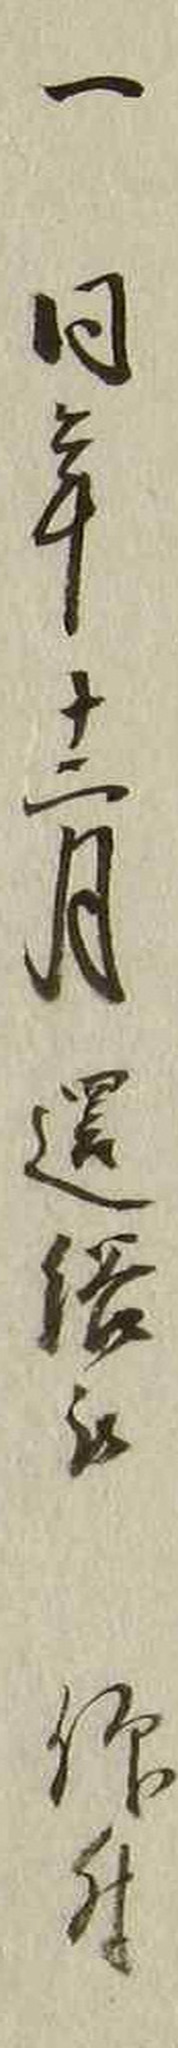一同年十二月還俗被仰付
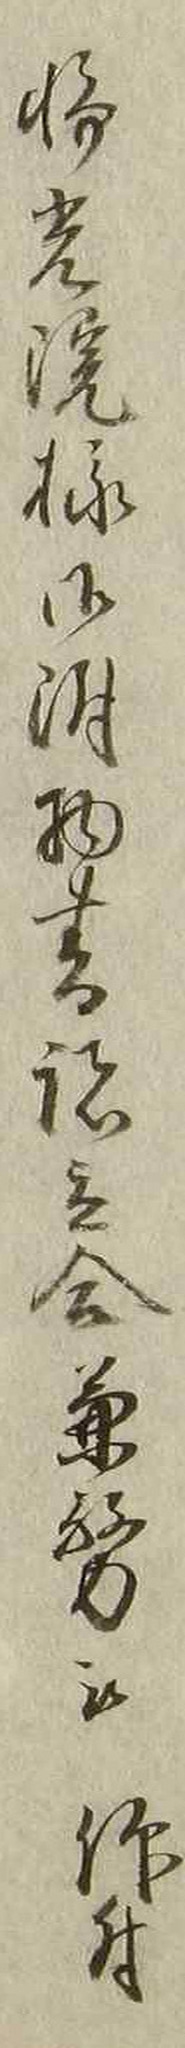輪光院様御附物書諸立合兼務被仰付
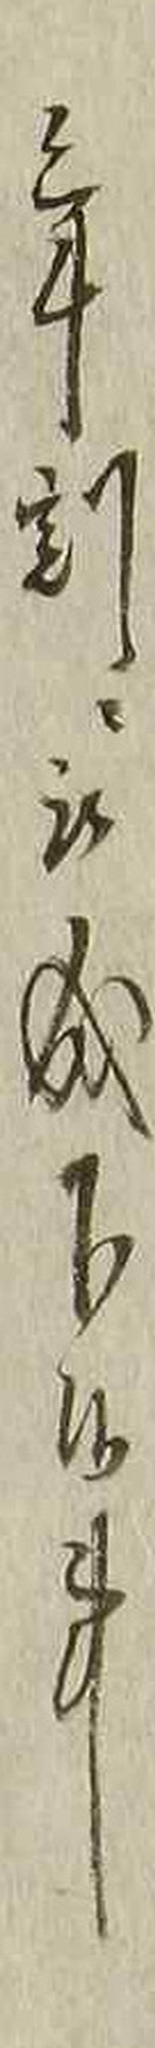年割ニ被成下事候
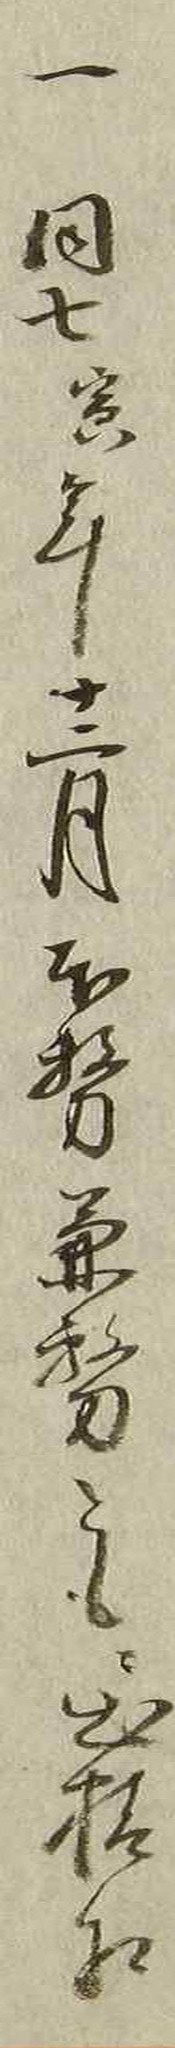一同七寅年十二月本務兼務ともニ出精相
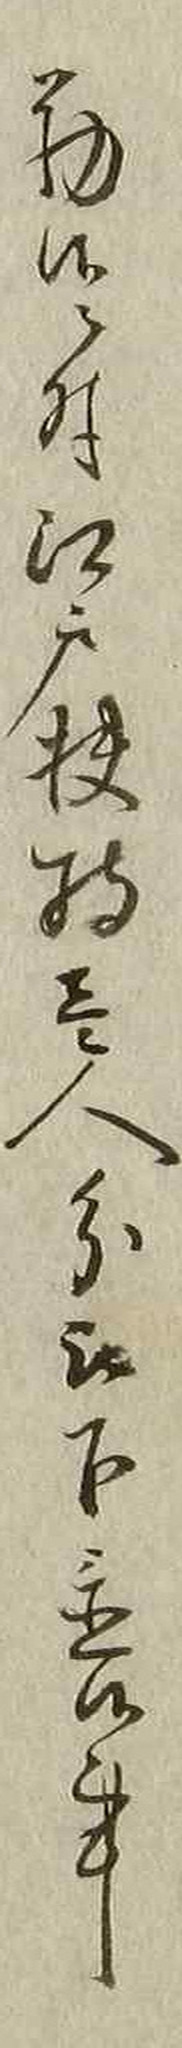勤候ニ付江戸扶持壱人分被下置候事
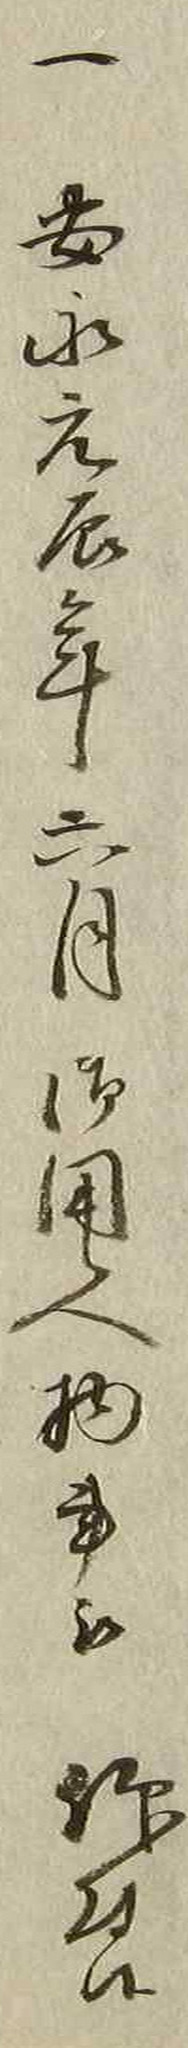一安永元辰年六月御用人物書被仰付候
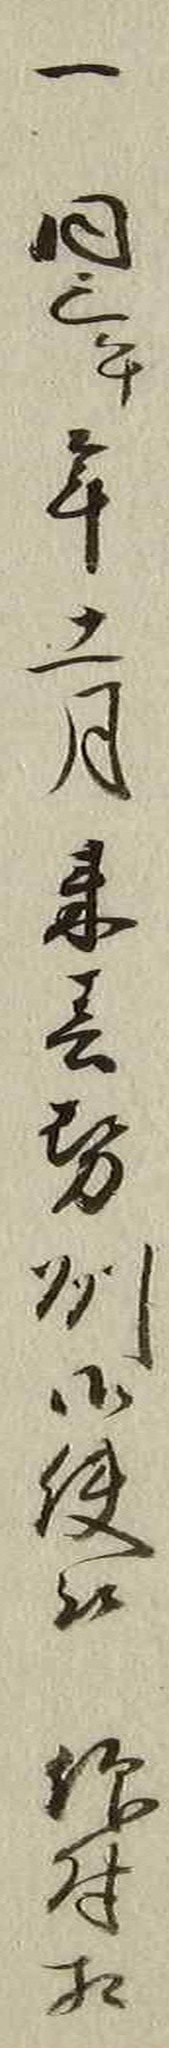一同三午年十一月来春勢州御使被仰付相
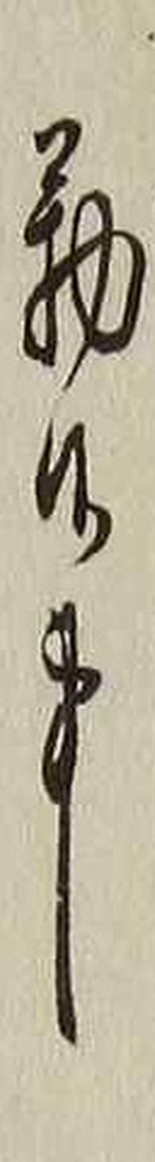勤候事
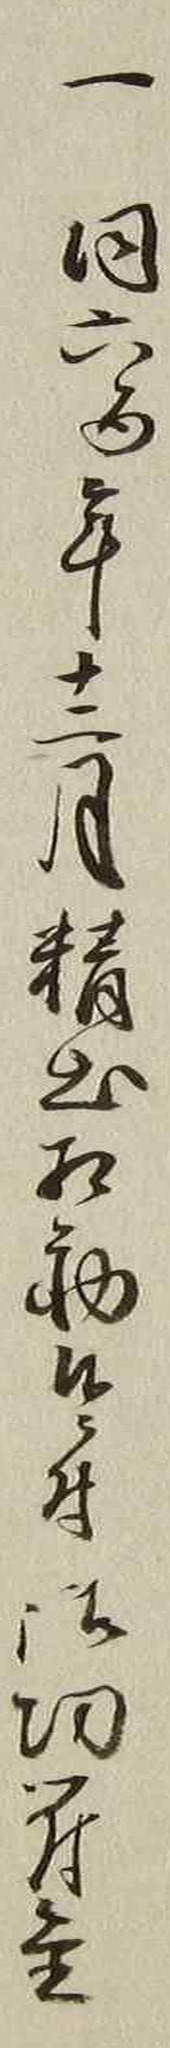一同六酉年十二月精出相勤候ニ付御切符金
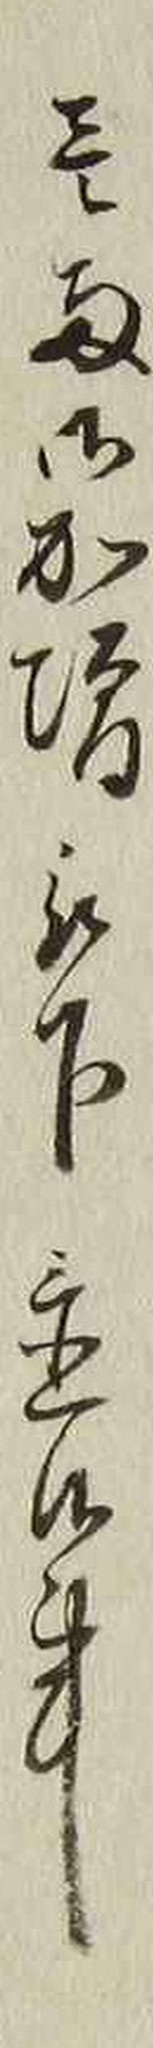壱両御加増被下置候事
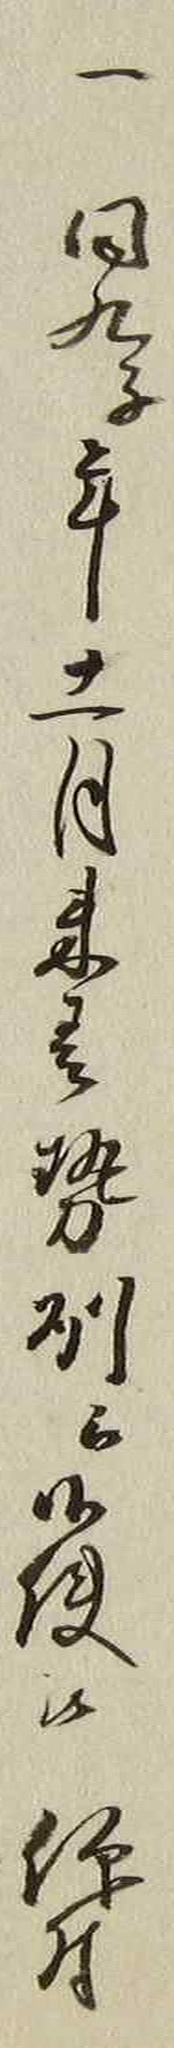一同九子年十一月来春勢州江御使被仰付
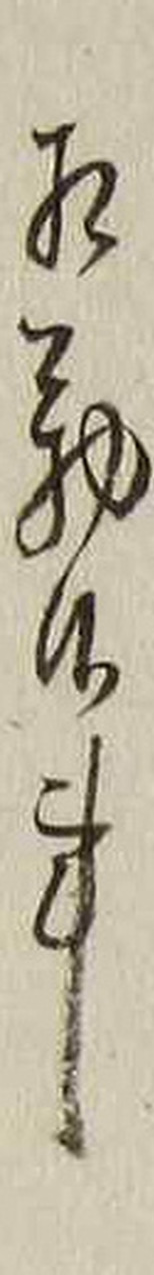相勤候事
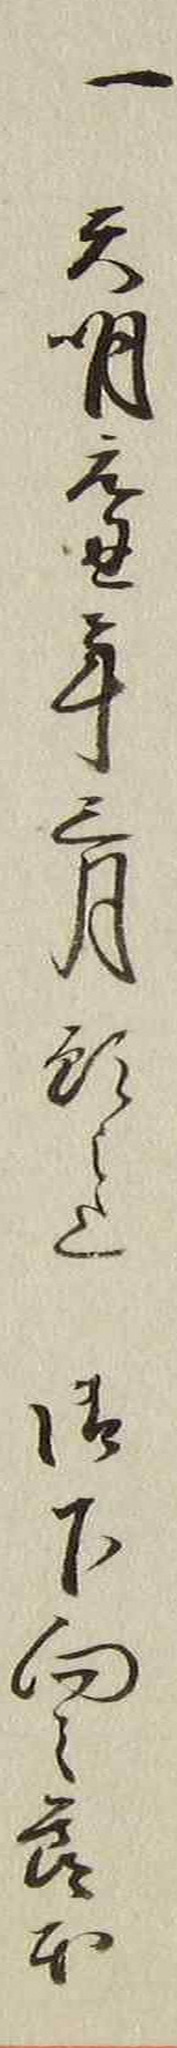一天明元丑年三月願之上御下向之節本
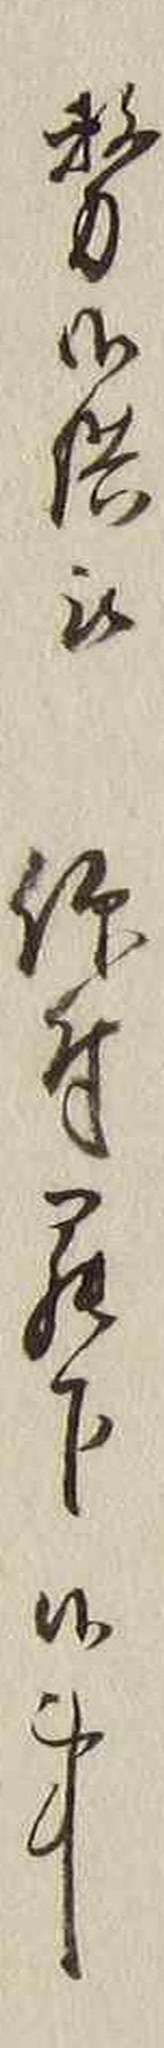務御供被仰付罷下候事
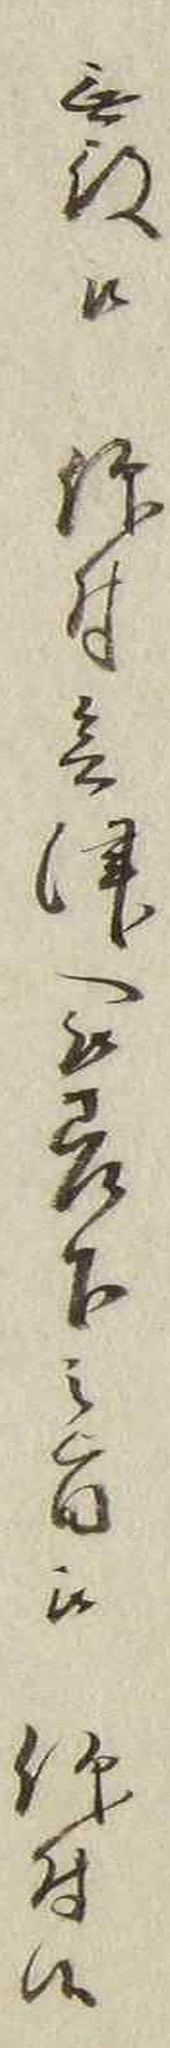無役被仰付会津へ被差下之旨被仰付候

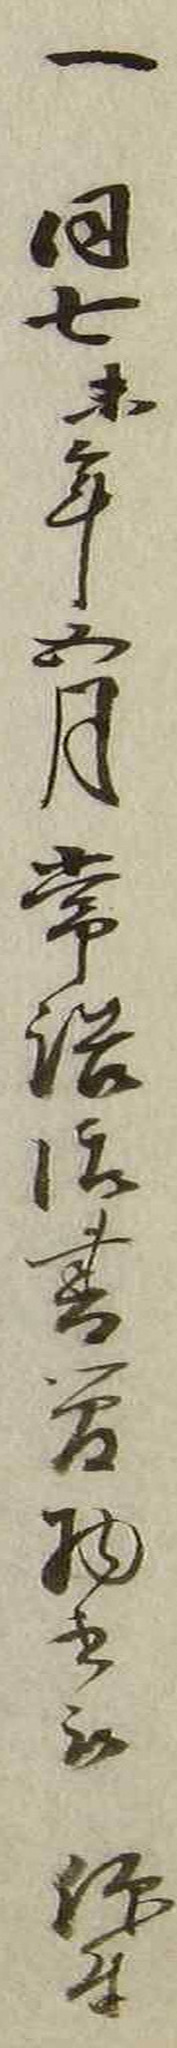一同七未年五月常詰御書簡物書被仰付
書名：諸士系譜　巻之132　た之部8
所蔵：会津若松市立会津図書館
